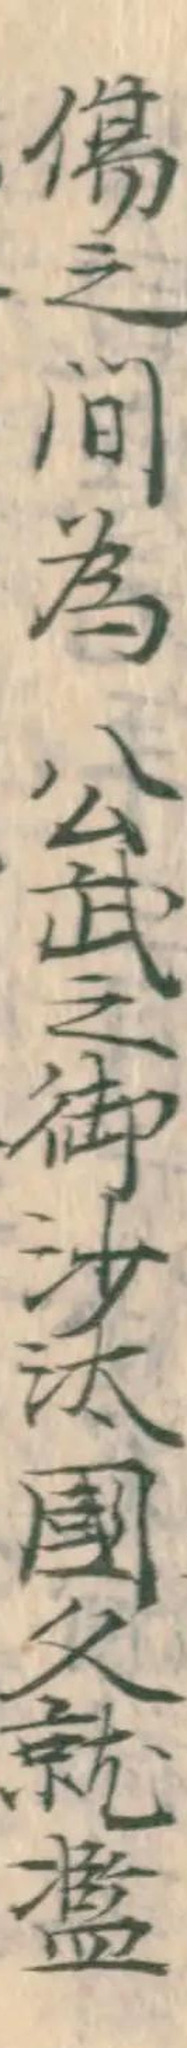傷之間為公武之御沙汰国久就濫
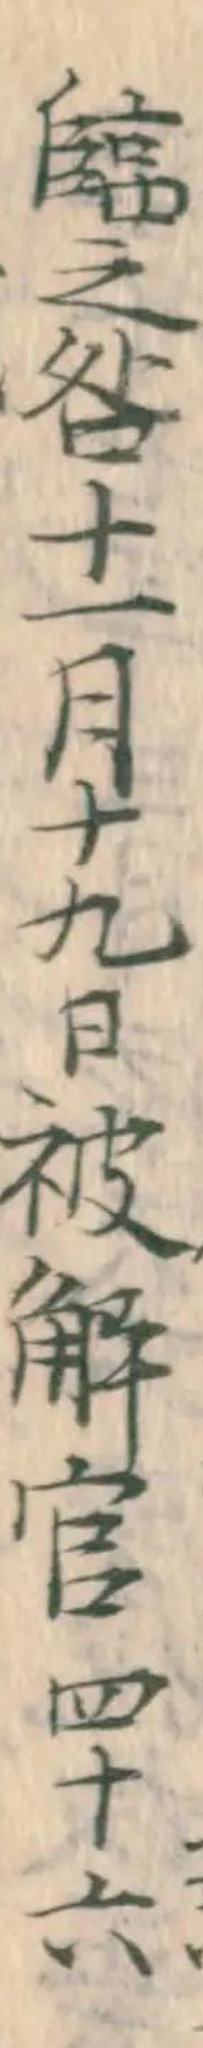臨之咎十一月十九日被解官四十六
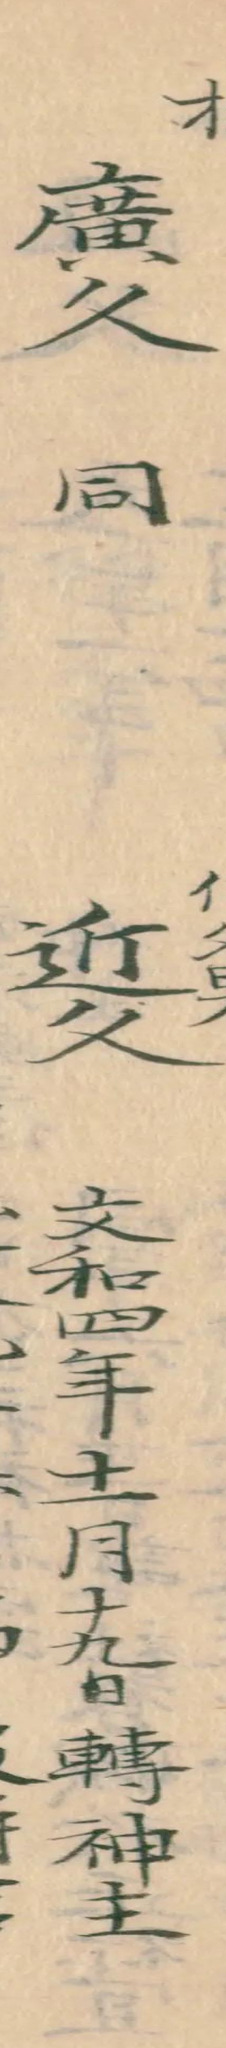広久同近久文和四年十一月十九日転神主
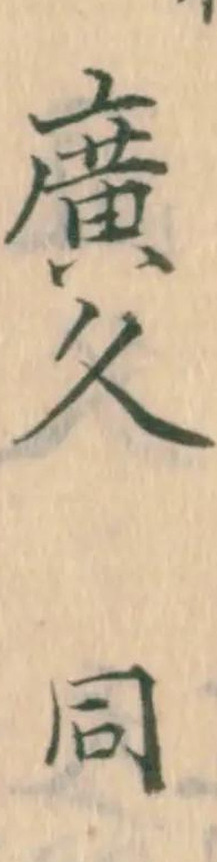泰久同
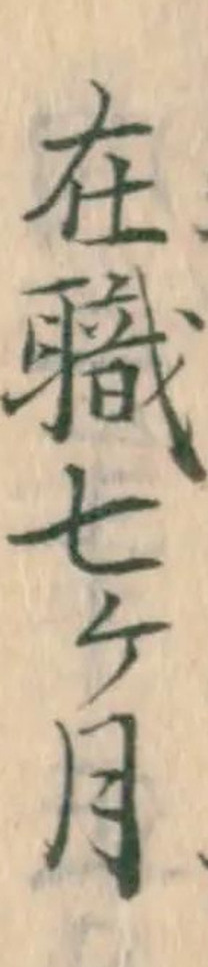在職九ケ月
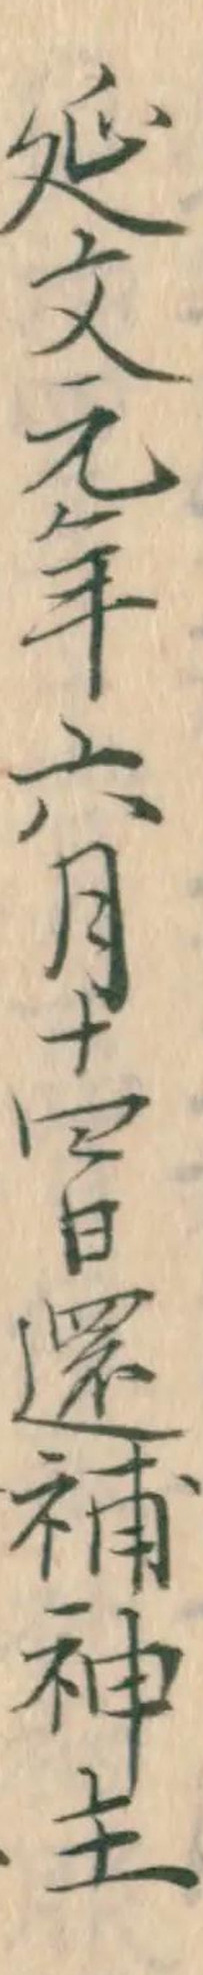員平延文二年四月廿五日還補神主
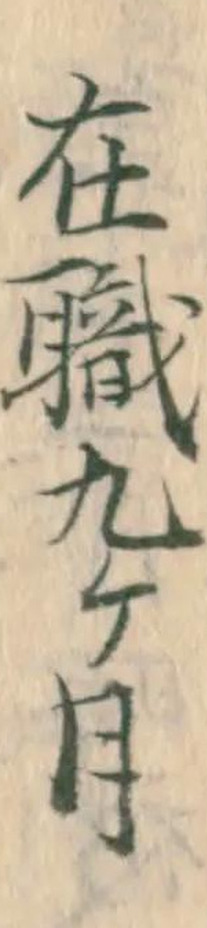在職九ケ月
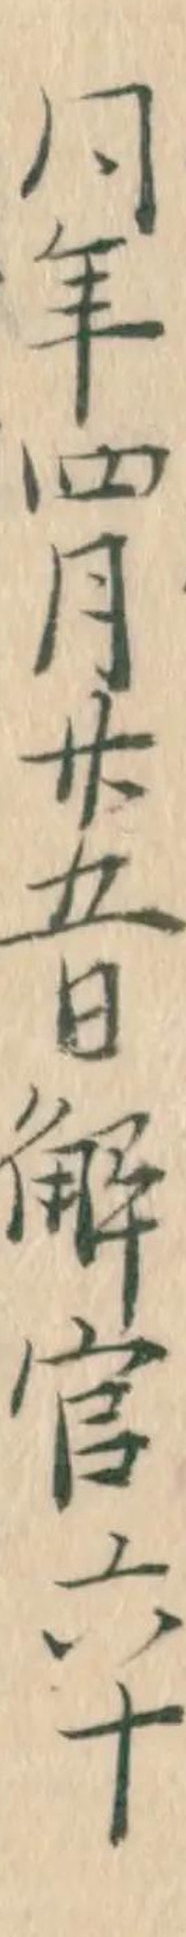同年四月廿五日解官六十
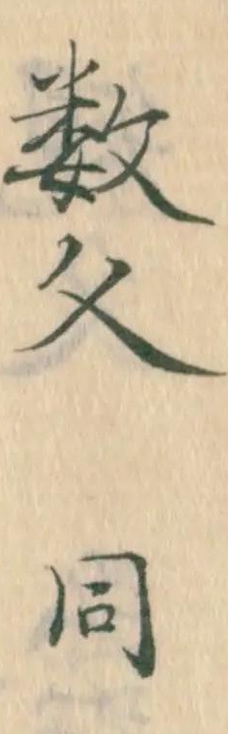泰久同
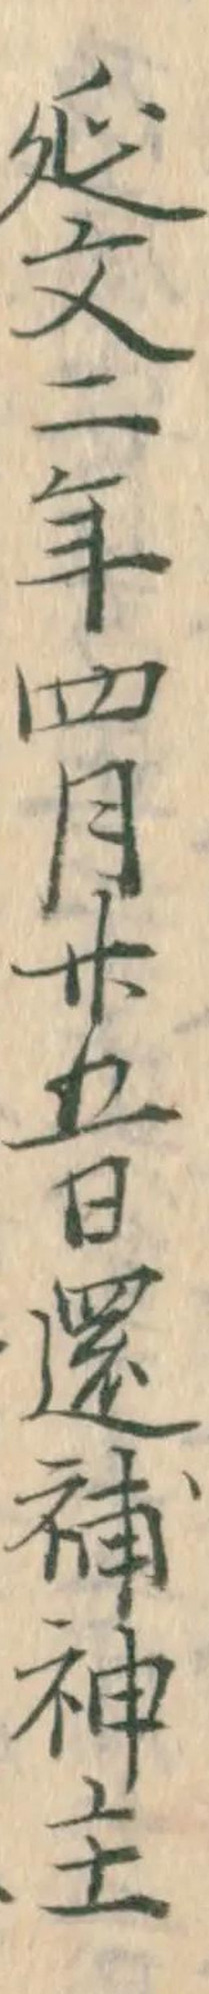員平延文二年四月廿五日還補神主
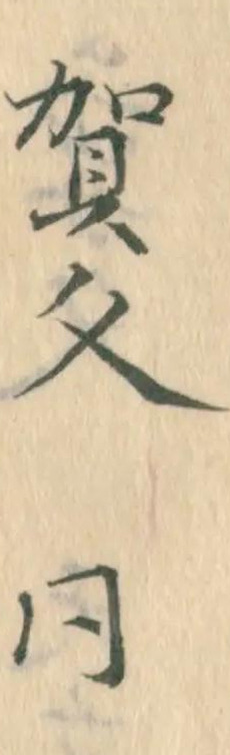泰久同

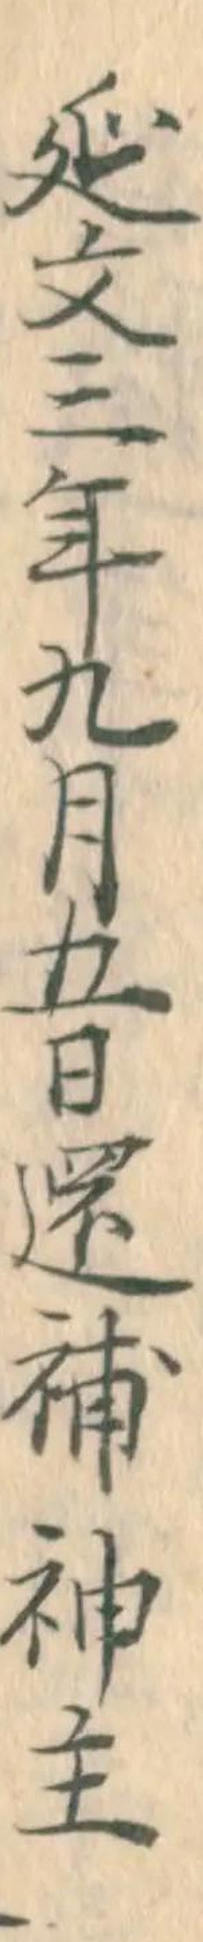教文延文三年九月五日還補神主
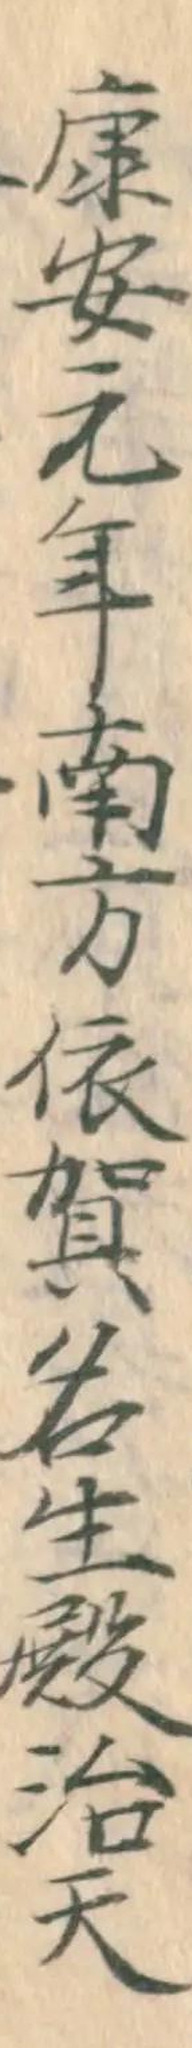康安元年南方依賀名生殿治天
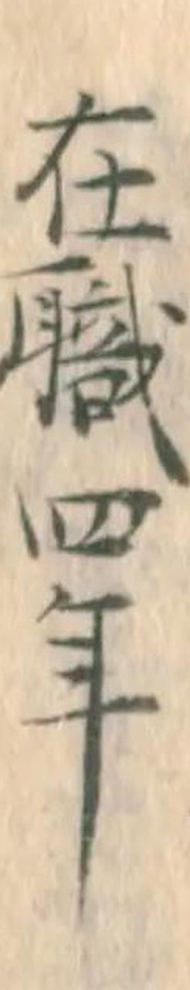在職四年
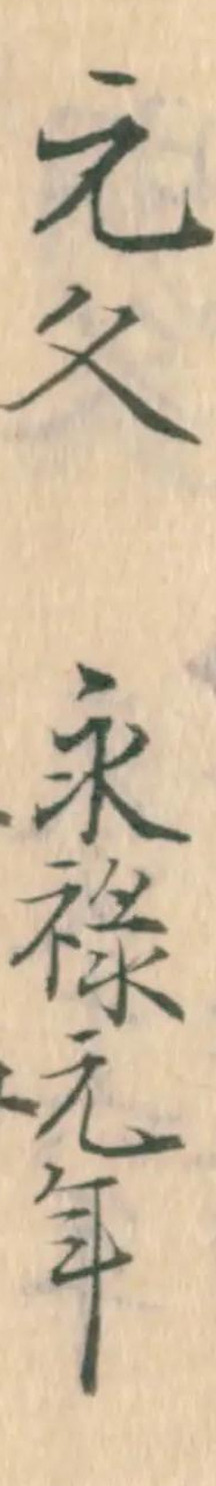以久文禄元年
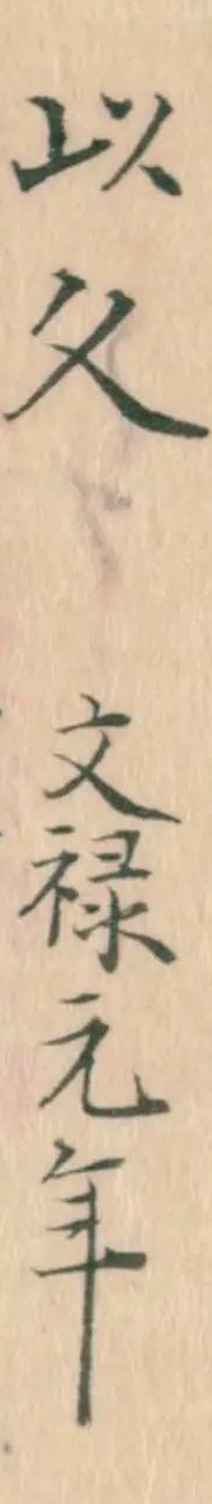以久文禄元年
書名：賀茂社記録. 第23冊
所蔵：国立国会図書館 National Diet Library, JAPAN
